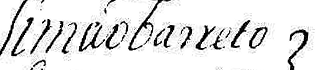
Simão barreto
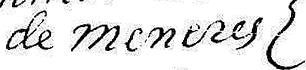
de Menezes
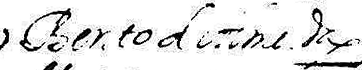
Bento d Almeida
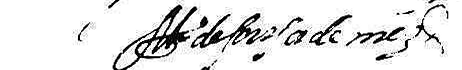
Al.ro de Sousa de mez
